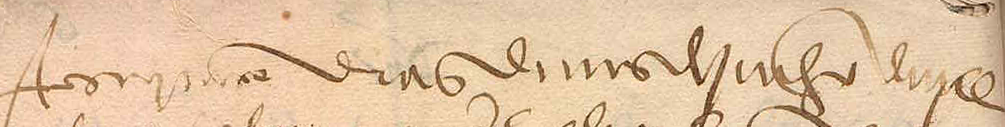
Aos cymco dias do mes de Junho de mjll
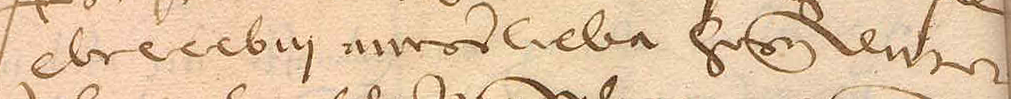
e bc xxxbiij anos ē lixboa ho s̄or doutor
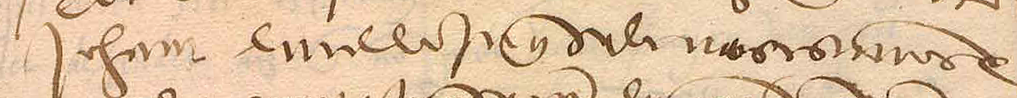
Joham de mello Jnq̄sydor nos estaos e
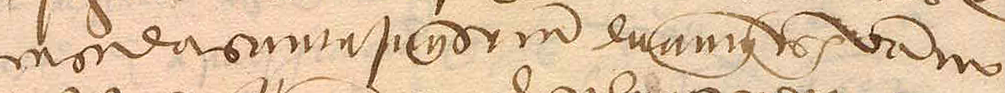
casa da santa Jnq̄syçā deu a mȳ esp̄vā no
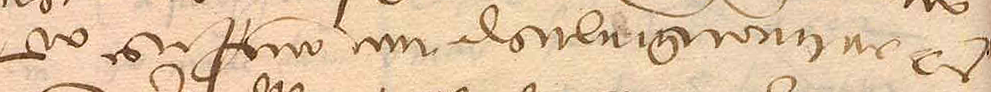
tro este feito com desembarguo atras e ē
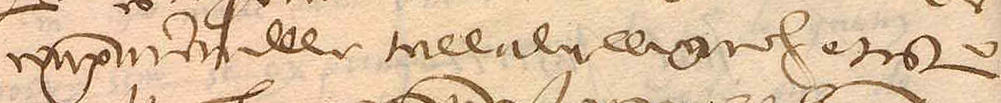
conp̄mēto delle trelladey lloguo ho testo
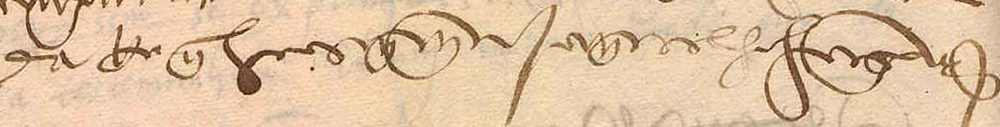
da Re q̄ he o seguj̄te Jorge coelho ho esp̄vy
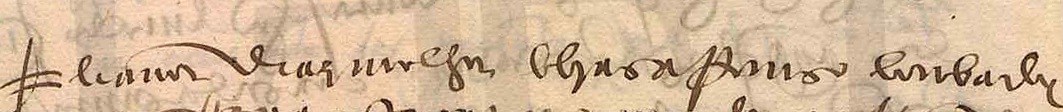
item lianor diaz molher de bras afomso bonbardey
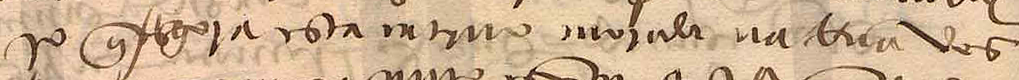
ro q̄ agora esta catyuo morador na Rua dos
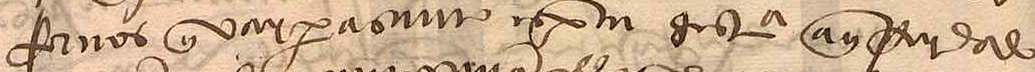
fornos q̄ vay ꝑa santo esp̄tu testa a q̄ foy dado
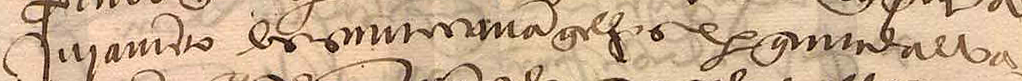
Juramēto dos santos auāgelhos e ꝑguntada deva
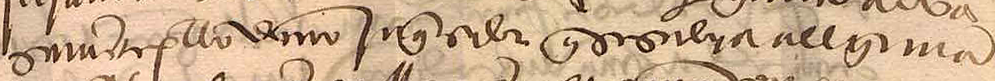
samēte p̄llo dito Jnq̄sydor q̄ se sabya allguma
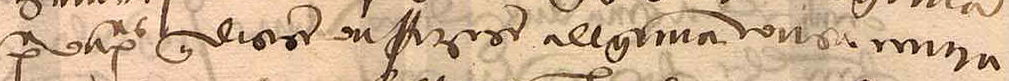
pa ou pas q̄ disesē ou fizesē allguma cousa contra
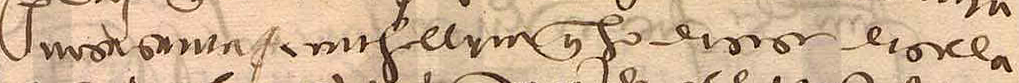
nosa santa fe cathollyca q̄ ho disese dise ella
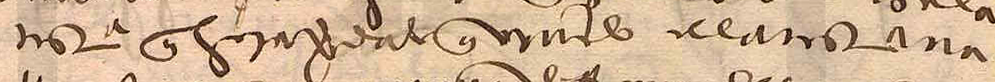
testa q̄ hera ꝟdade q̄ viuēdo ella testa na
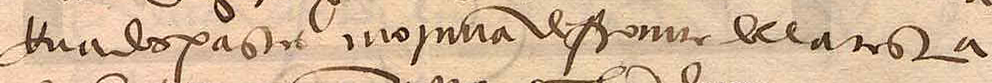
Rua dos pastes moraua defromte della testa
